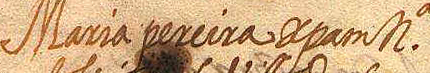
Maria pereira xpam N.a
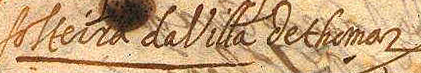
solteira da Villa de thomar
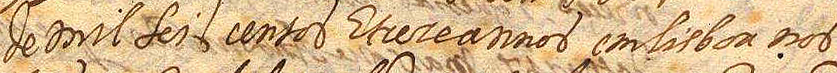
de mil seiscentos E treze annos em lisboa nos
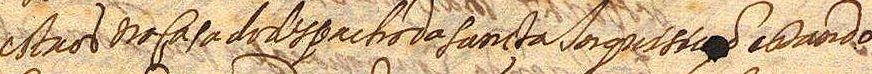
estaos na Casa do despacho da Sancta Inquisiç_õ estando
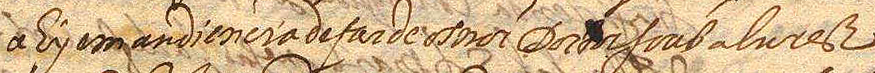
ahy em audiencia de tarde o snor̄ Doutor Joaõ alures
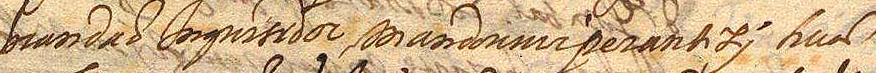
brandaõ Inquisidor, mandou uir perante sy huā
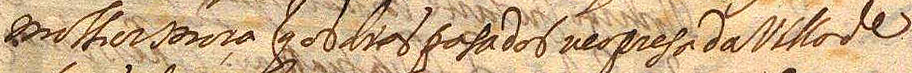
molher moça q̄ os dias pasados ueo presa da Villa de
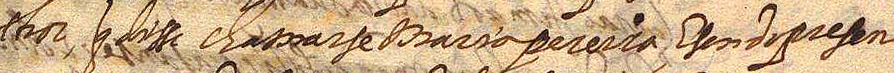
thor, q̄ disse chamarse Maria pereira, E sendo presen
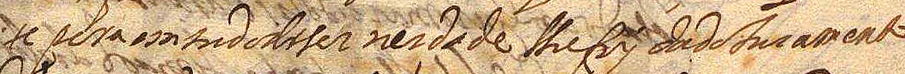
te pera em tudo diser uerdade lhe foy dado Iuramentto
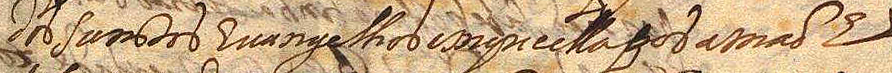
dos Santos Euangelhos em que ella pos a maõ E
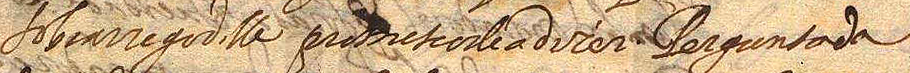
sob carrego delle prometeo de a dizer. Perguntada
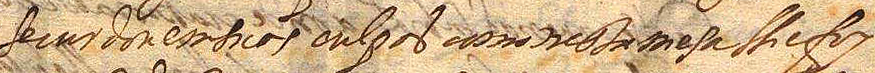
se cuidou em suas culpas como nesta mesa lhe foy
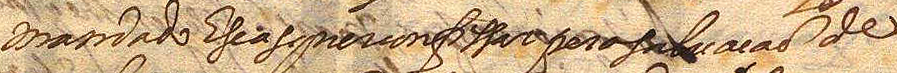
mandado e se as quer confessar pera saluaçaõ de
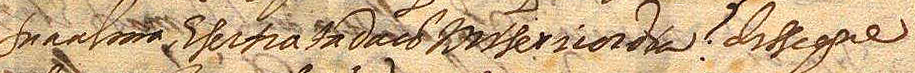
sua alma, E ser tratada cõ misericordia? disse que
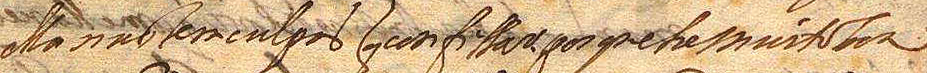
ella naõ tem culpas q̄ confissar porque he muito boa
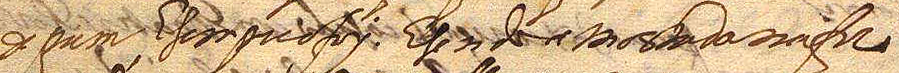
xpam, E sempre o foy. E sendo amoestada na for
